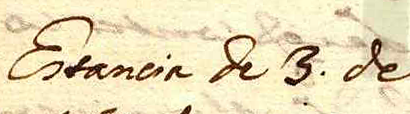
Estancia de 3. de
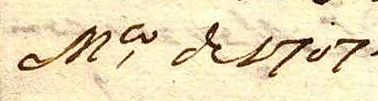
Mço de 1707.
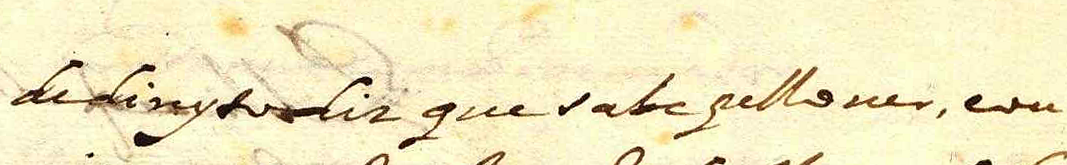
de direyto diz que sabe pello uer, e ou
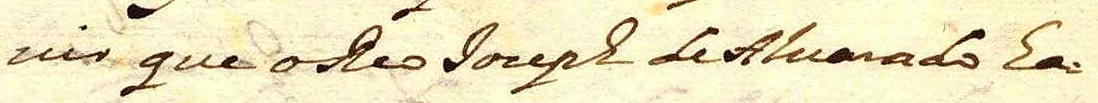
uir que o Reo Iozeph de Aluarado ha
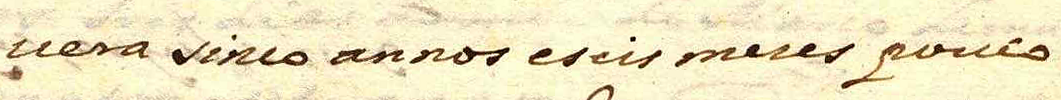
uera sinco annos e seis mezes pouco
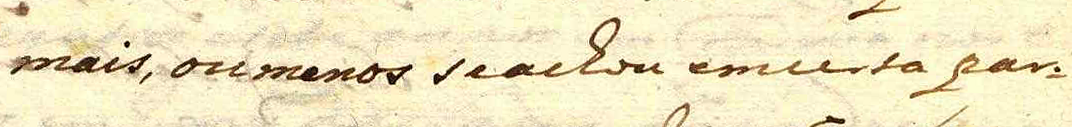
mais, ou menos se achou em certa par
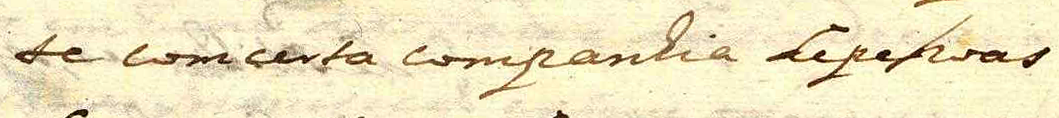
te com certa companhia de pessoas
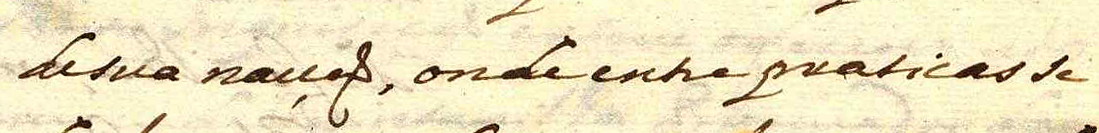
de sua nacçaõ, onde entre praticas se
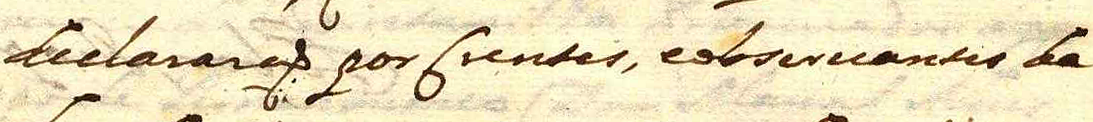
declararaõ por Crentes, e obseruantes da
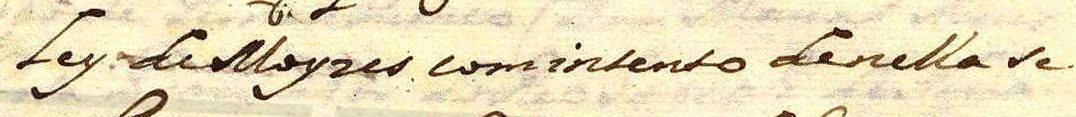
Ley de Moyzes com intento de nella se
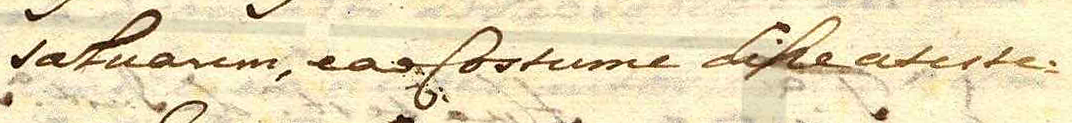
saluarem, e ao Costume disse a teste
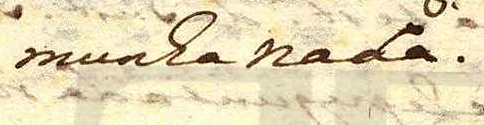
munha nada.
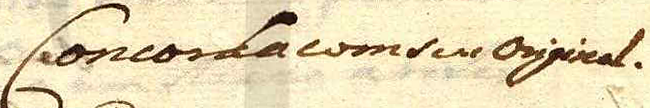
Concorda com seu original.
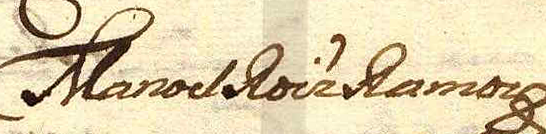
Manoel Roiz̄ Ramoz
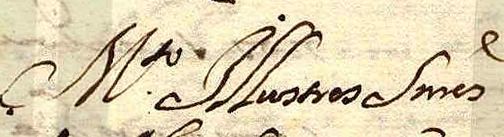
M.to Illustres Snres̄
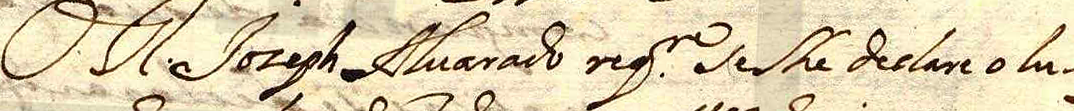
O R. Iozeph Aluarado req.re se lhe declare o lu
